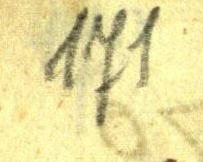171
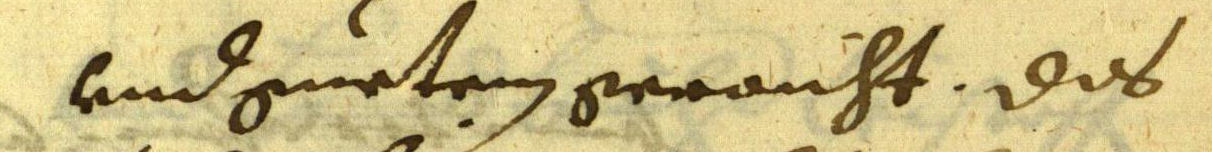vnd gūetem geraicht. das
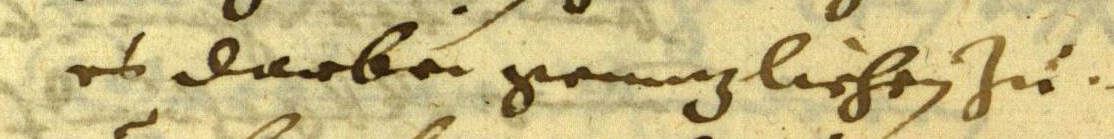es darbei gennzlichen Zū¬
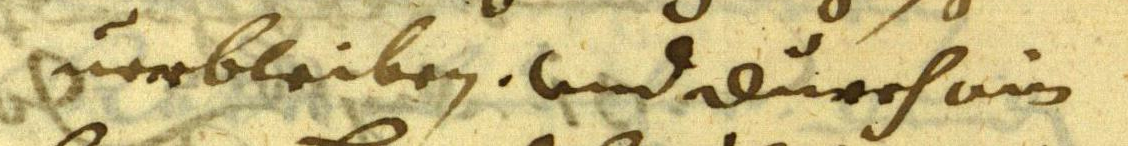verbleiben. vnd dūrch ain
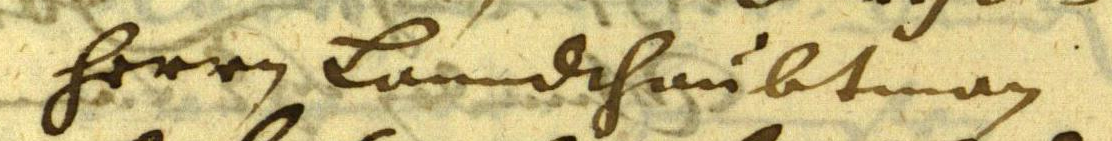herrn Lanndthaūbtman
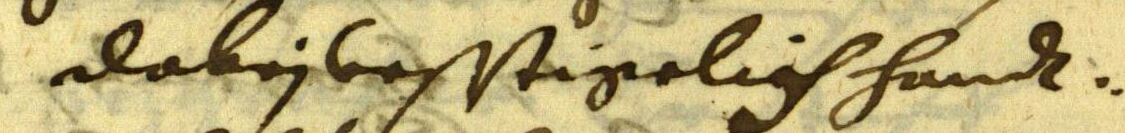dabej vesstigelich handt¬
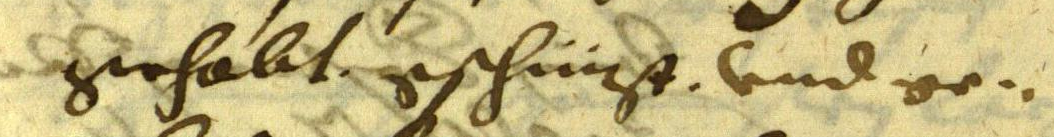gehabt. gschützt. vnd ge¬
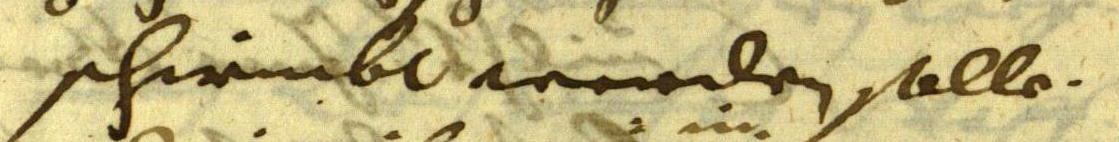schirmbt werden solle.
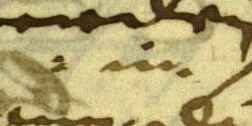:in.
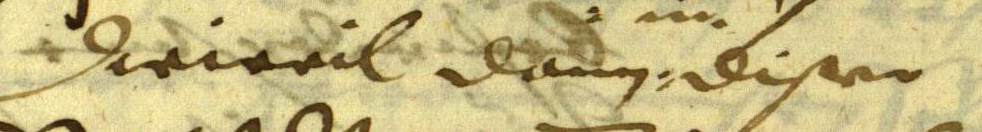Dieweil dann : diser
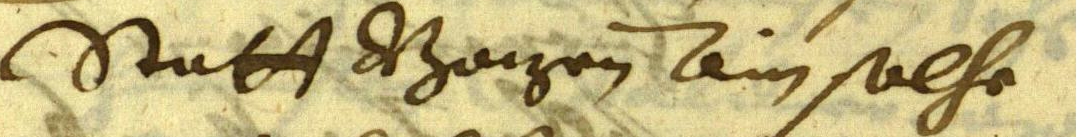Statt Bozen Ain solhe
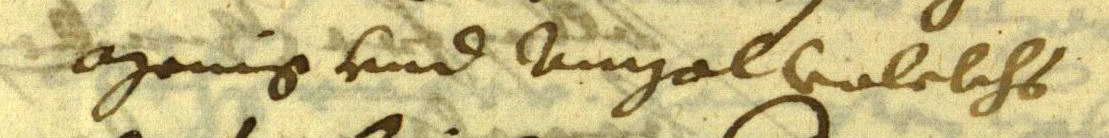Menig vnd Anzal volckhs
